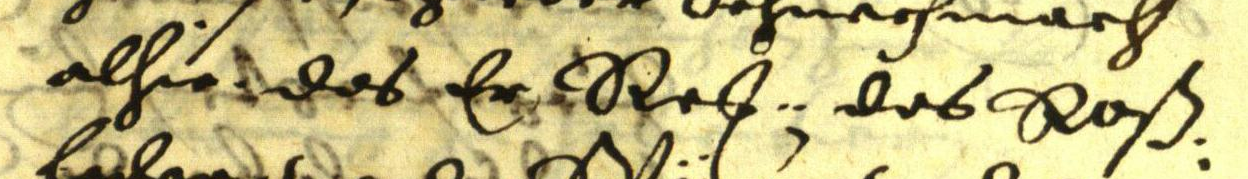alhie. das Er Re: das Roß¬
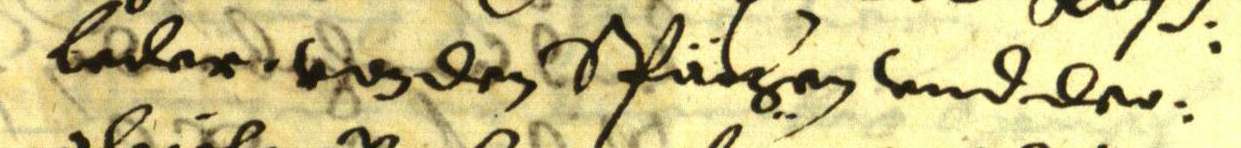leder. von den SPäzen vnd der¬
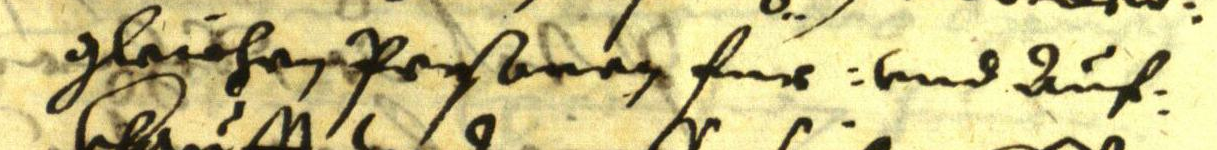gleichen Personen fir: vnd Aūf¬
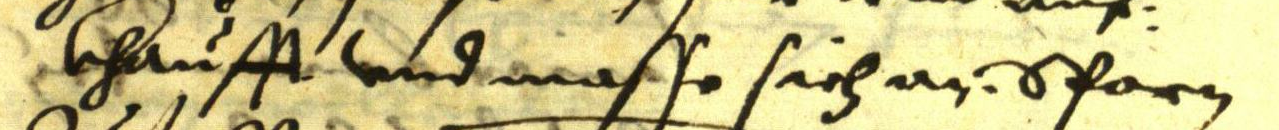khaūfft vnd masse sich an. Sporn
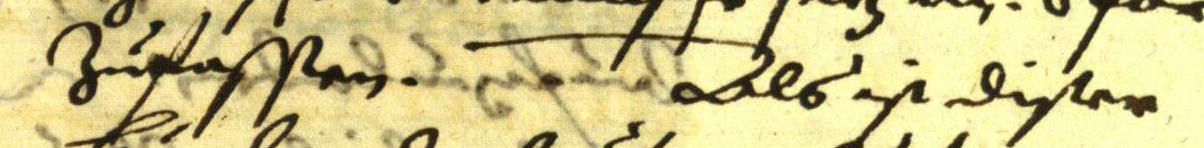Zūfassen. Als ist diser
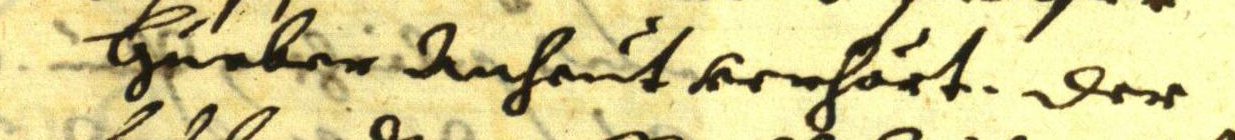Hūeber Anheūt verhōrt. der
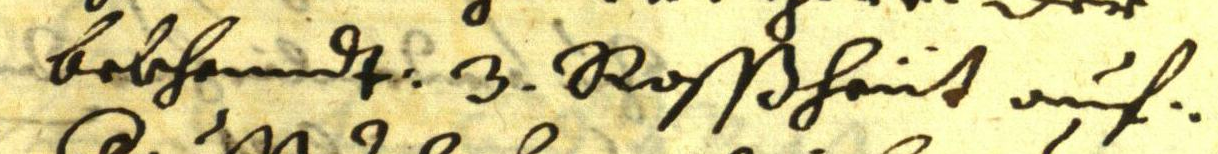bekhonndt: 3. Rosßheüt aūf¬
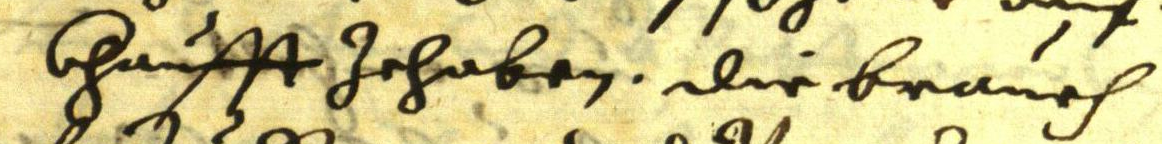khaūfft Zehaben. die braūch
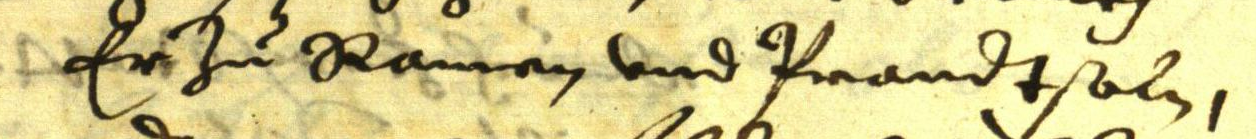Er Zū Ramen vnd Prandtsoln,
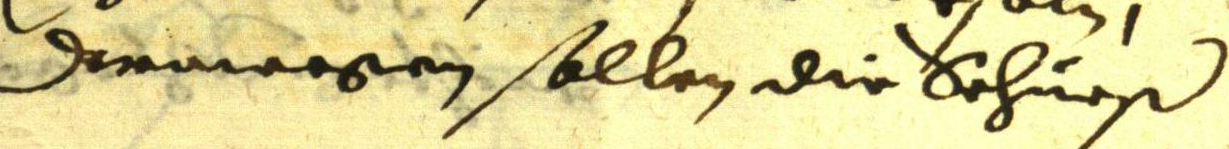Derowegen sollen die Schūest
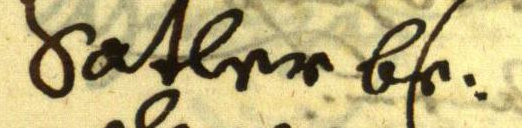Satler be¬
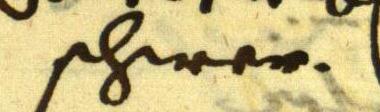schwer.
